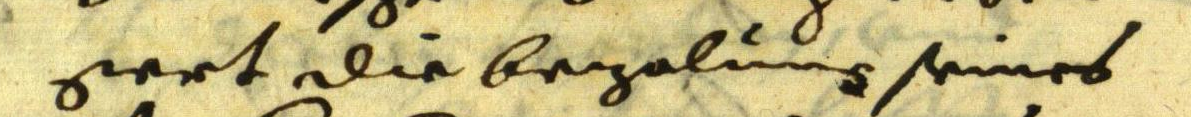gert die bezalūng seines
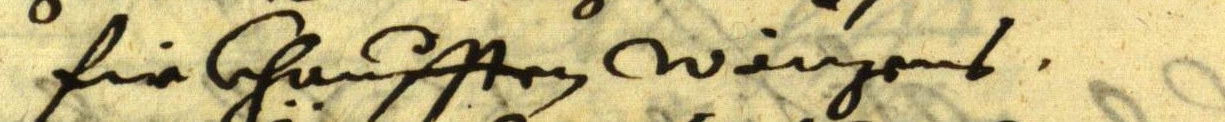fir khaūfften waizens.
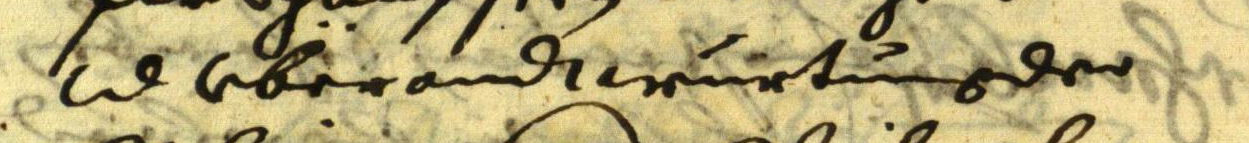vnd v̈berandtwūrtūng der
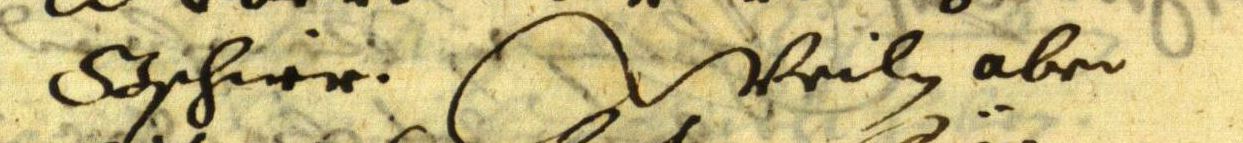Gschirr. Weiln aber
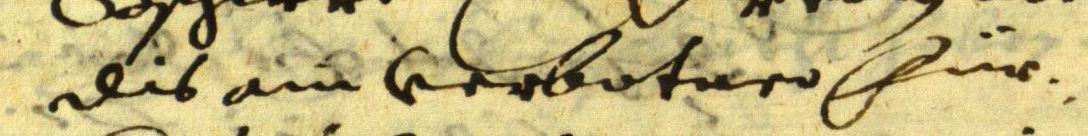dis ain verbotner Für¬
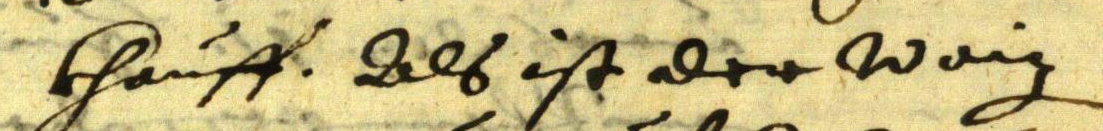khaūff. Als ist der Waiz
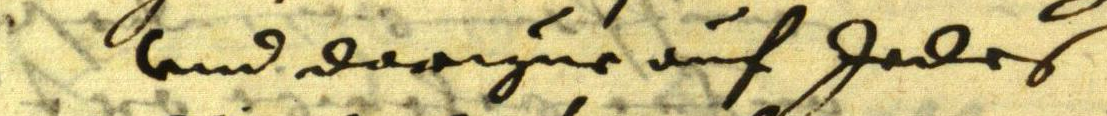vnd darzūe aūf Jedes
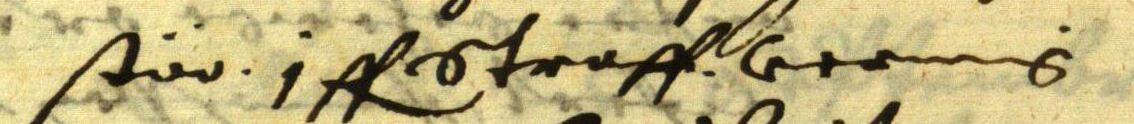stär. 1 fl Straff. vermig
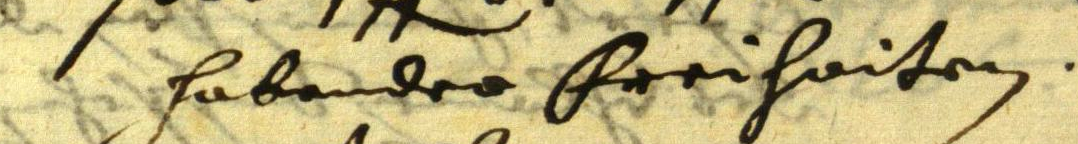habender Freihaiten.
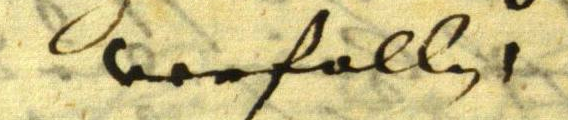verfalln,
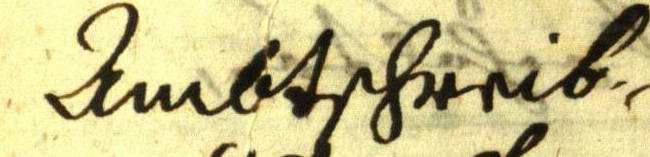Ambtschreib¬
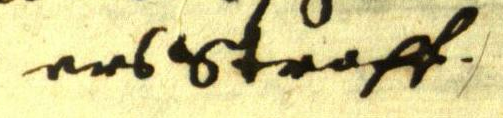ers Straff.
